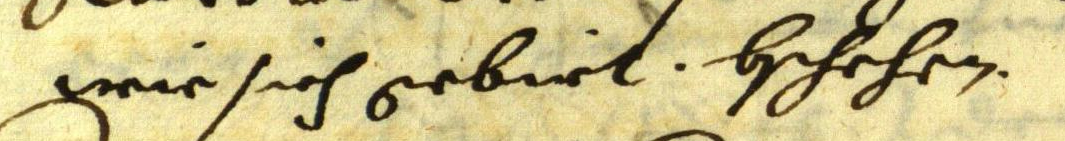wie sich gebirt. beschehen.
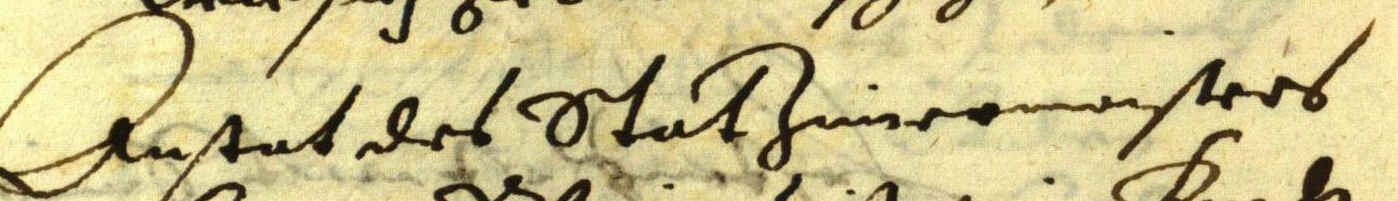Anstat des Stat Zinsmaisters
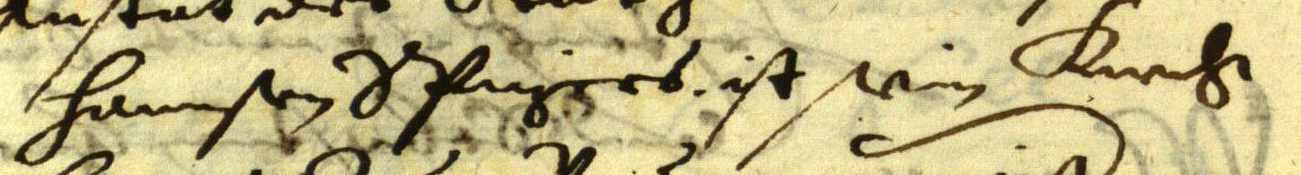hannsen Spitzers. ist sein Knecht
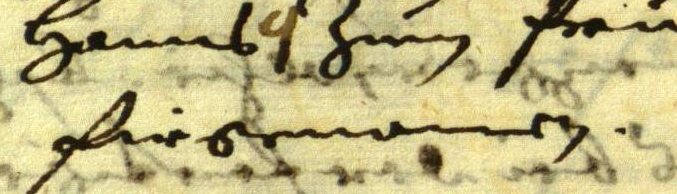firgenomen.
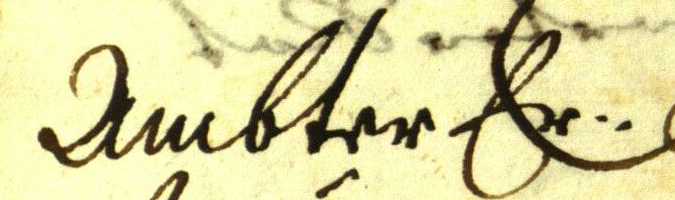Ambter Er¬
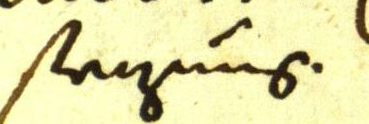sezūng.
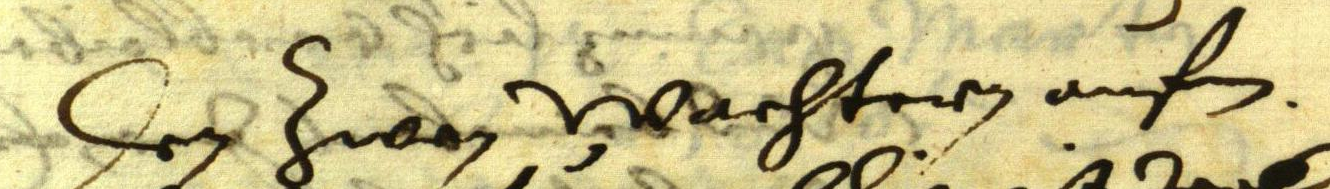Den Zwen Wachtern aūfm.
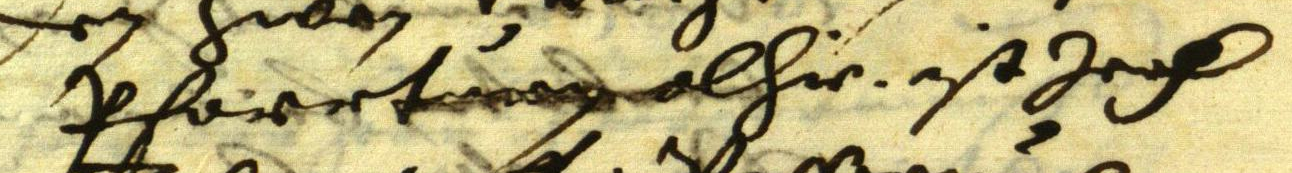Pfarrtūrm alhie. ist Jerl
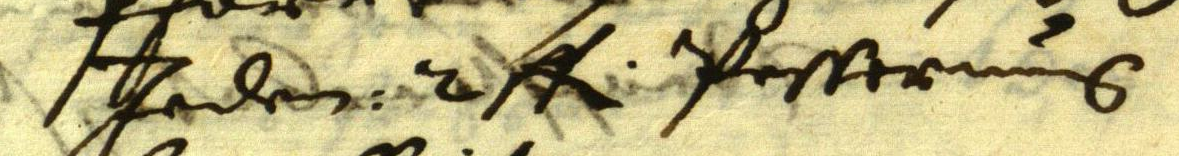Jedem: 2 fl. Pesserūng
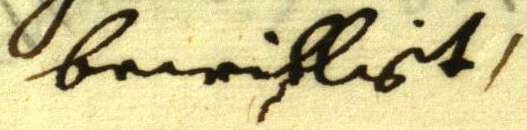bewilligt,
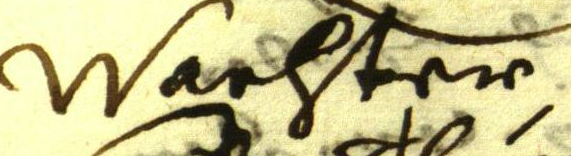Wachter
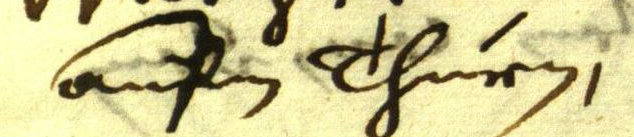aūfm Thūrn,
